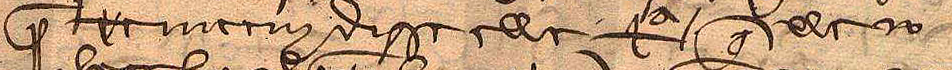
p̄temcem disse elle ta / q̄ elle co
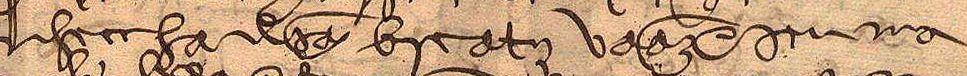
nhece ha dita breatiz vaāz e seu ma
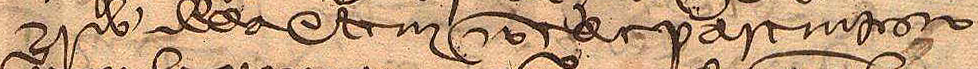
rjdo della e tem c̄o elle paremtesco
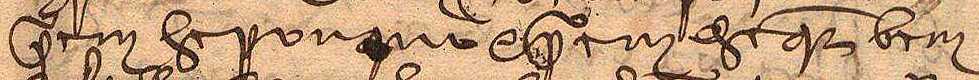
p̄oem he pouquo e p̄oem lhe q̄r bem
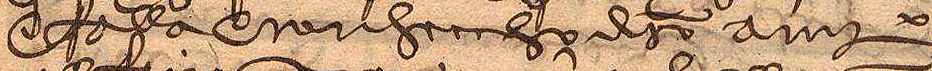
e falla e conhece ho dito amto
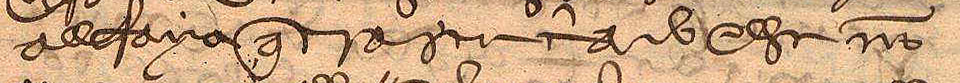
allfaya q̄ era seu c̄ado e lhe nō
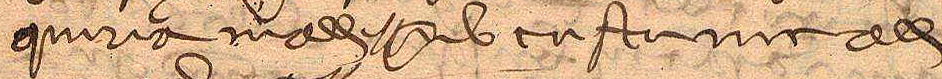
queria mall // e do custume all
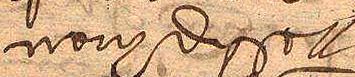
nom disse
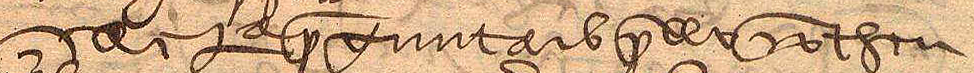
item elle ta p̄guntado p̄llo c̄otheu
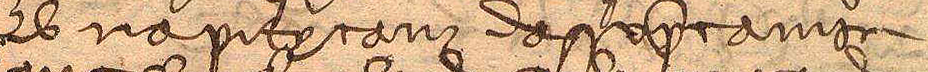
do na pityçam da ssop̄camte
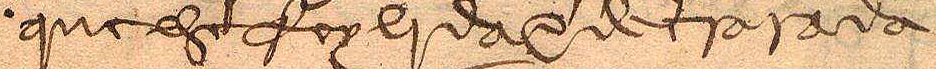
que lhe foy ljda e decrarada
